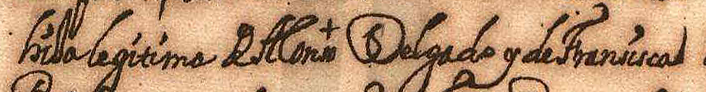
hija legitima de Alonso Delgado y de Francisca
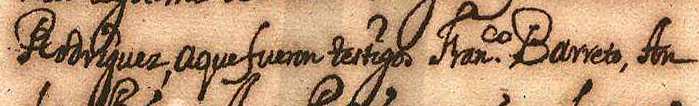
Rodriguez, a que fueran testigos Fran.co Barreto, An
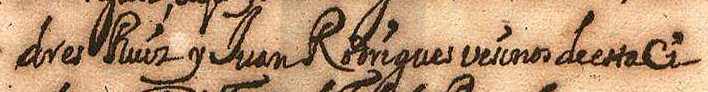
dre Ruiz y Iuan Rodrigues vesinos de esta Ci
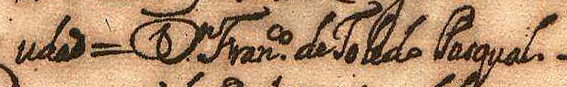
udad = Dn Fran.co de Toledo Pasqual.
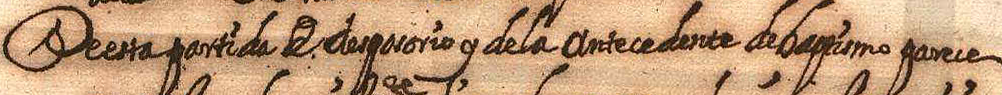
De esta partida de desposorio y de la antecedente de baptismo parece
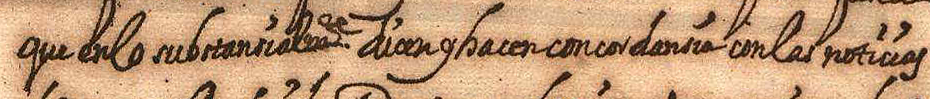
que en lo substansialmte dicen y hacen concordansia con las noticias
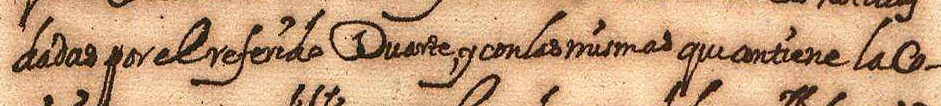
dadas por el referido Duarte, y con las mismas que contiene la Co
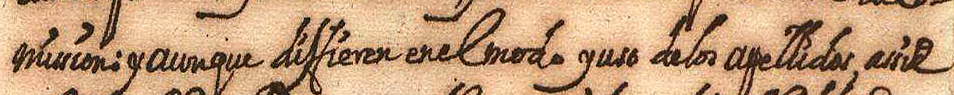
mission: y aunque diffieren en el modo y uso de los apellidos, assi de
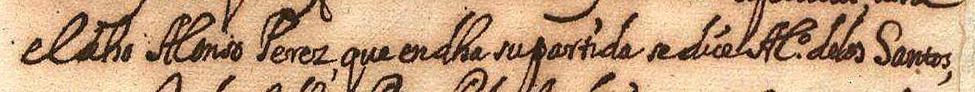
el dho Alonso Perez, que en dha su partida se dice Al.o de los Santos,
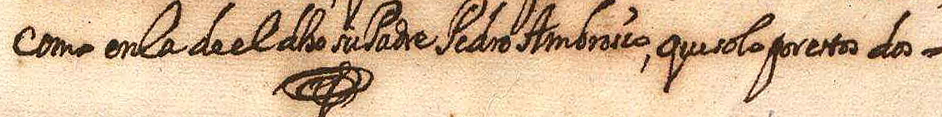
como en la de el dho su Padre Pedro Ambrosio, que solo por estos dos
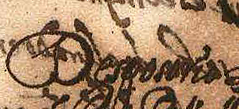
Desposorio
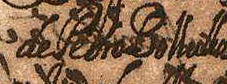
de Pedro Bollullos
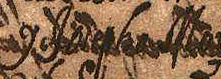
y Jozepha Ma
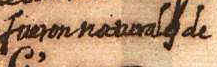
fueron naturales de
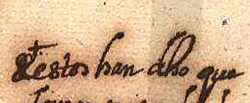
& estos ham dho que
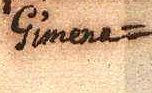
Gimena =
